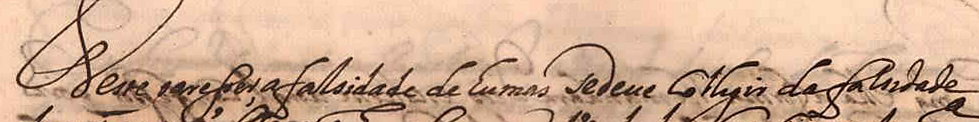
Neste pareser a falsidade de humas se deue Collegir da falsidade
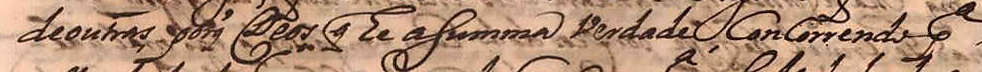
de outras porq̄ Deos q̄ he a summa verdade Concorrendo pa
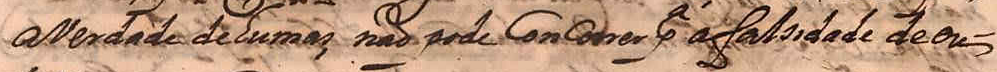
a verdade de humas, naõ pode Concorrer pa a falsidade de ou
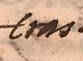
tras.
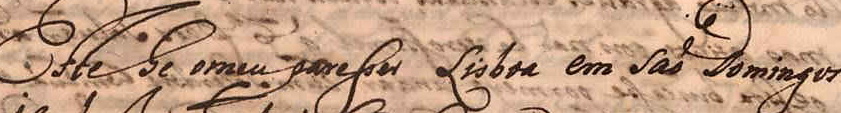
Este he o meu paresser Lisboa em Saõ Domingos
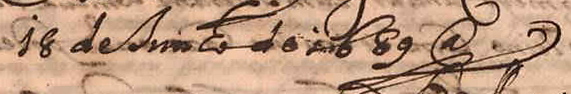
18 de Iunho de 1689 ā
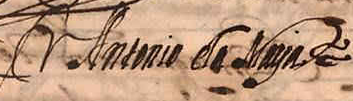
fr Antonio da Maya
